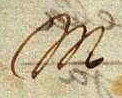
m
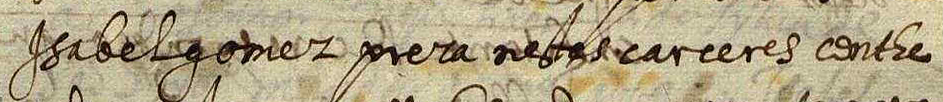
Jsabel gomez preza nestes carceres conthe
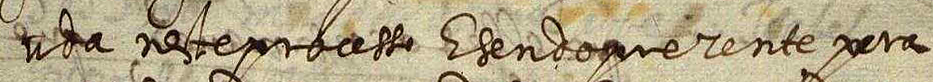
uda neste processo E sendo prezente pera
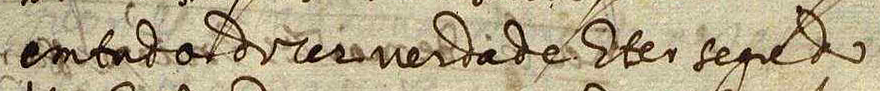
em todo dizer uerdade E ter segredo
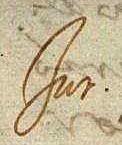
Jur.
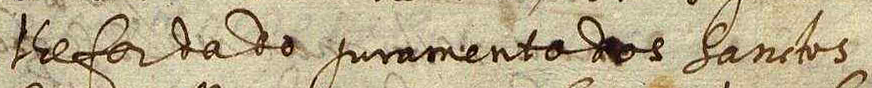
lhe foi dado juramento dos sanctos
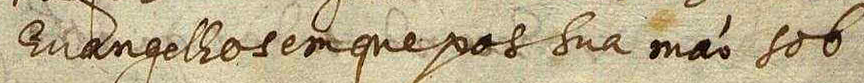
Euangelhos em que pos sua maõ sob
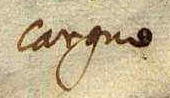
carguo
